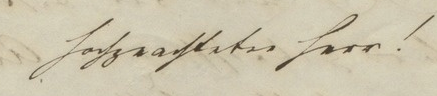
Hochgeachteter Herr!
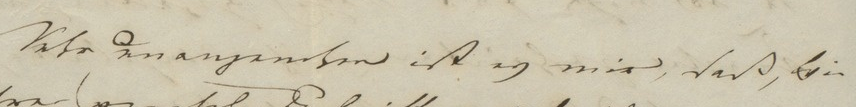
Sehr unangenehm ist es mir, daß, wie
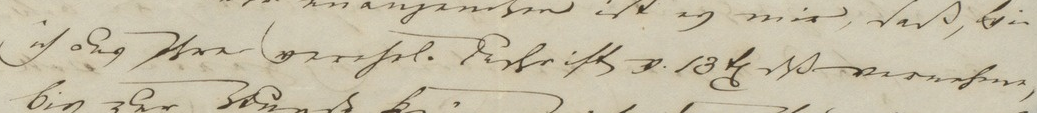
ich aus Ihrer verehrl. Zuschrift v. 13ten dß vernehme,
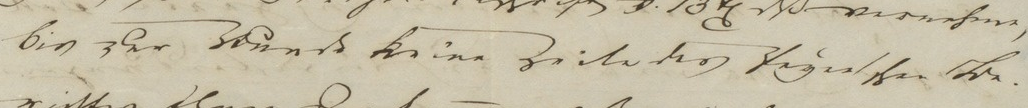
bis zur Stunde keine Zeile des Peyerschen Be-
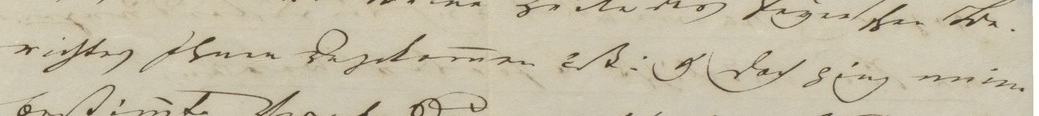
richtes Ihnen zugekommen ist & doch ging meine
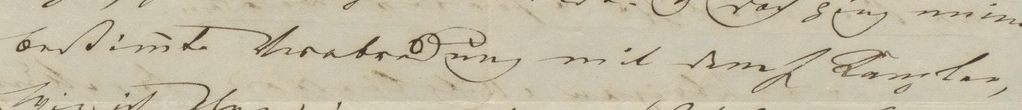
bestimmte Verabredung mit dem Herrn Kanzler,
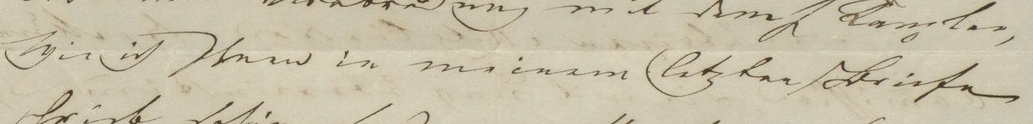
wie ich Ihnen in meinem letzten Briefe
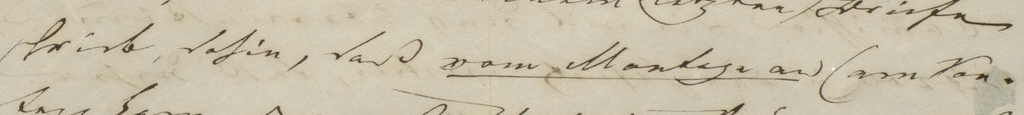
schrieb, dahin, daß vom Montage an (am Son-
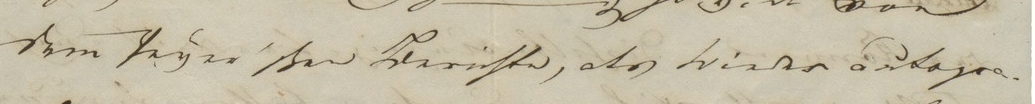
dem Peyer'schen Berichte, als wieder autogra-
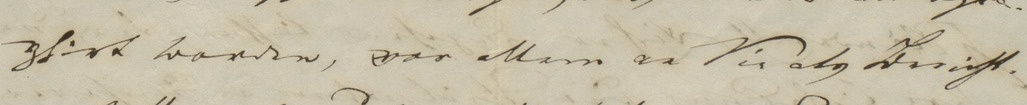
phirt worden, vor allem an Sie als Bericht-
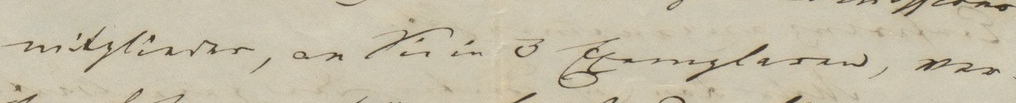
mitglieder, an Sie in 3 Exemplaren, ver-
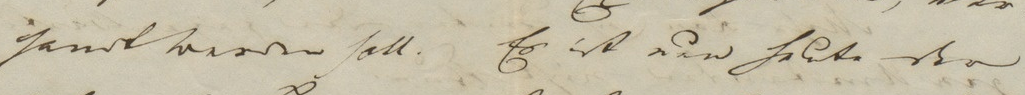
sendet werden soll. Es ist nun heute der
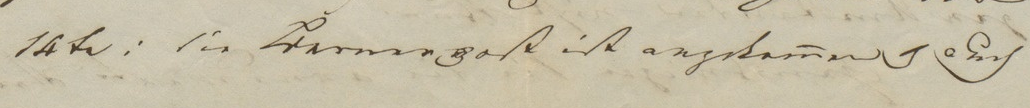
14te: die Bernerpost ist angekommen & auch
